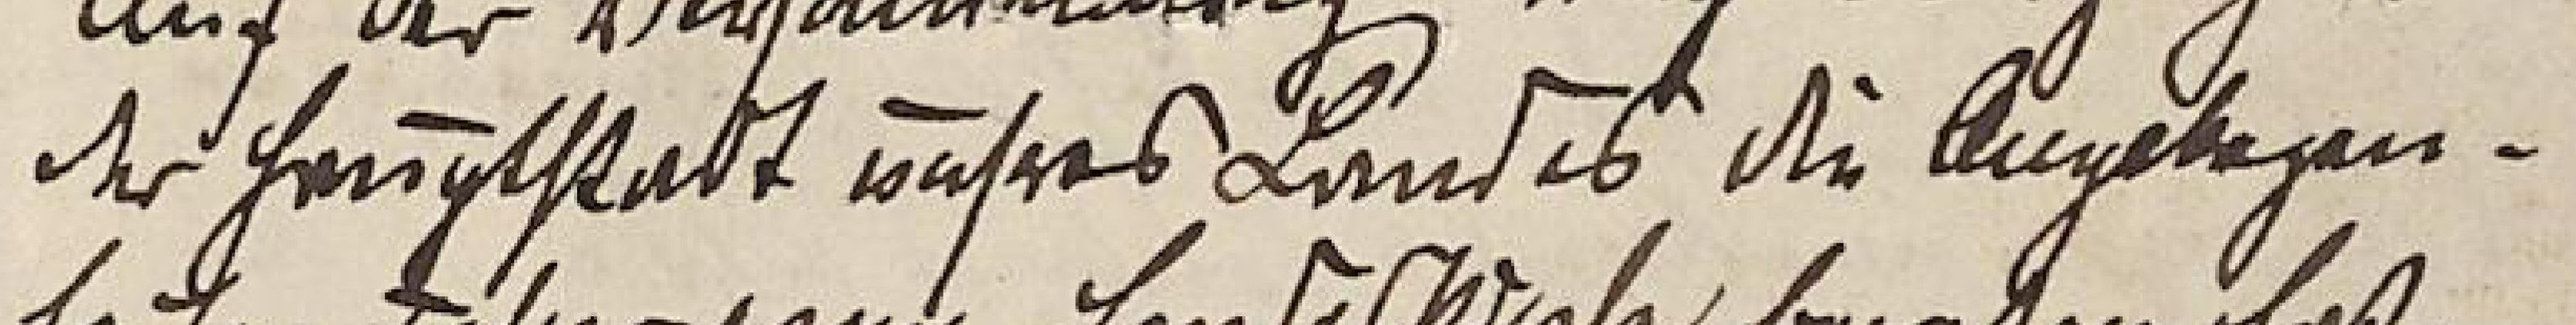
der Hauptstadt unsres Landes die Angelegen¬
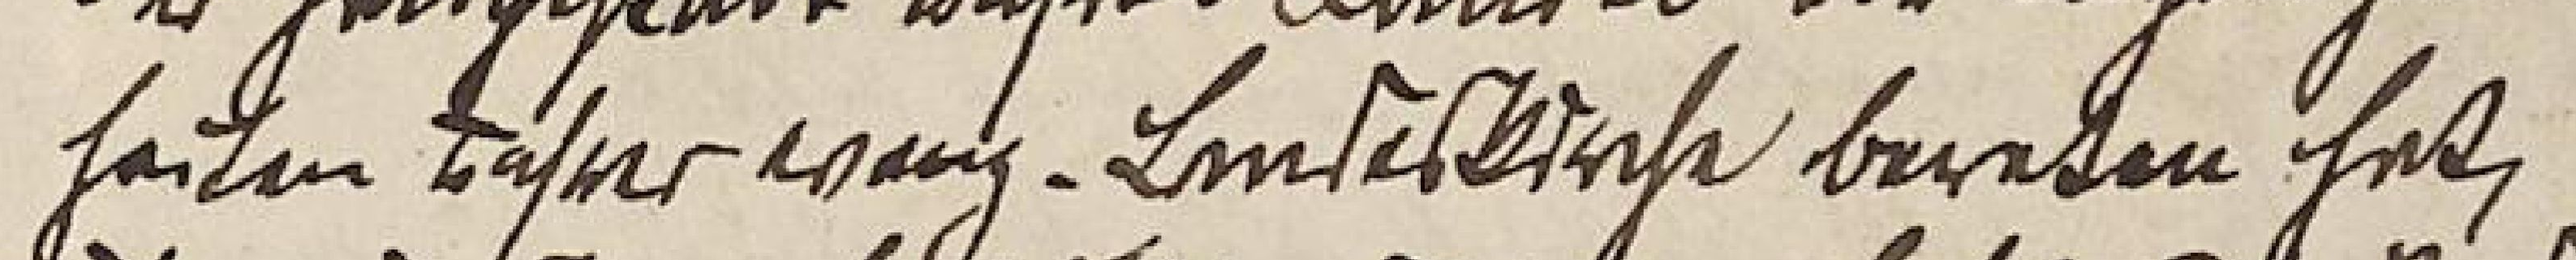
heiten unsrer evang. Landeskirche beraten hat,
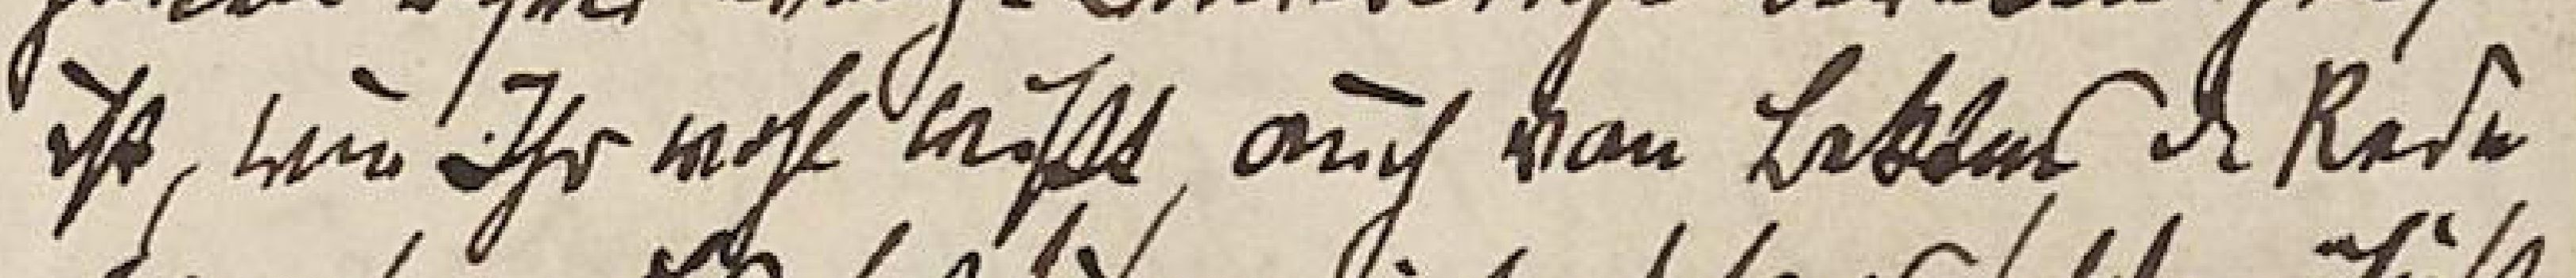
ist, wie Ihr wohl wißt, auch vom Bektns di. Rede
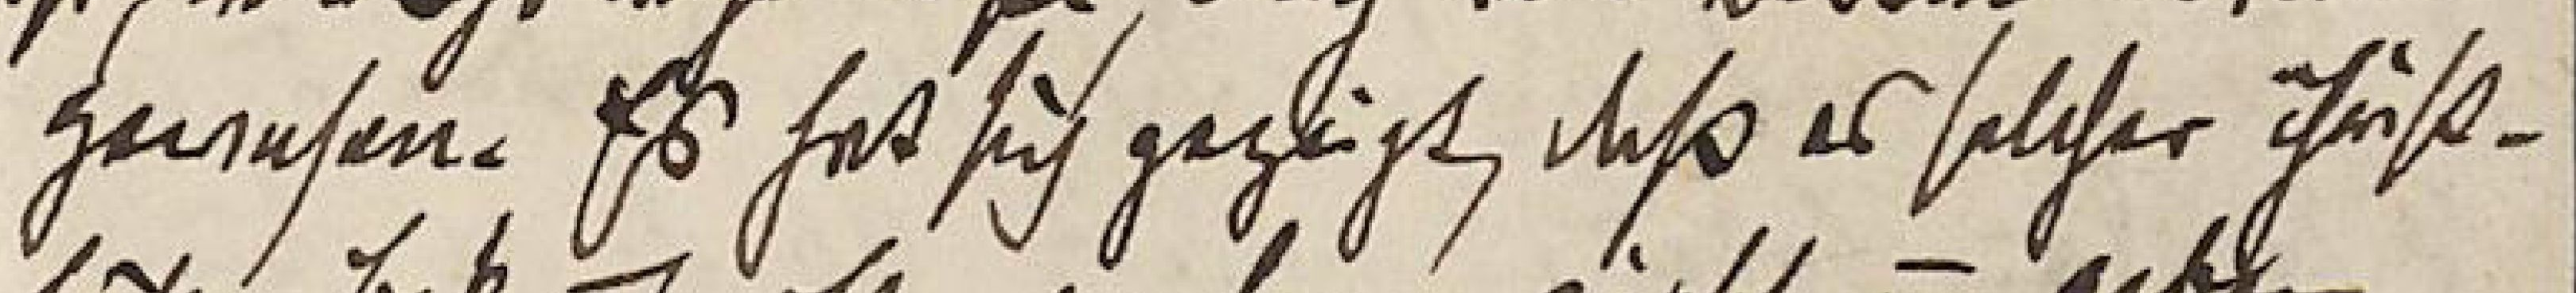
gewesen. Es hat sich gezeigt, daß es solcher christ¬
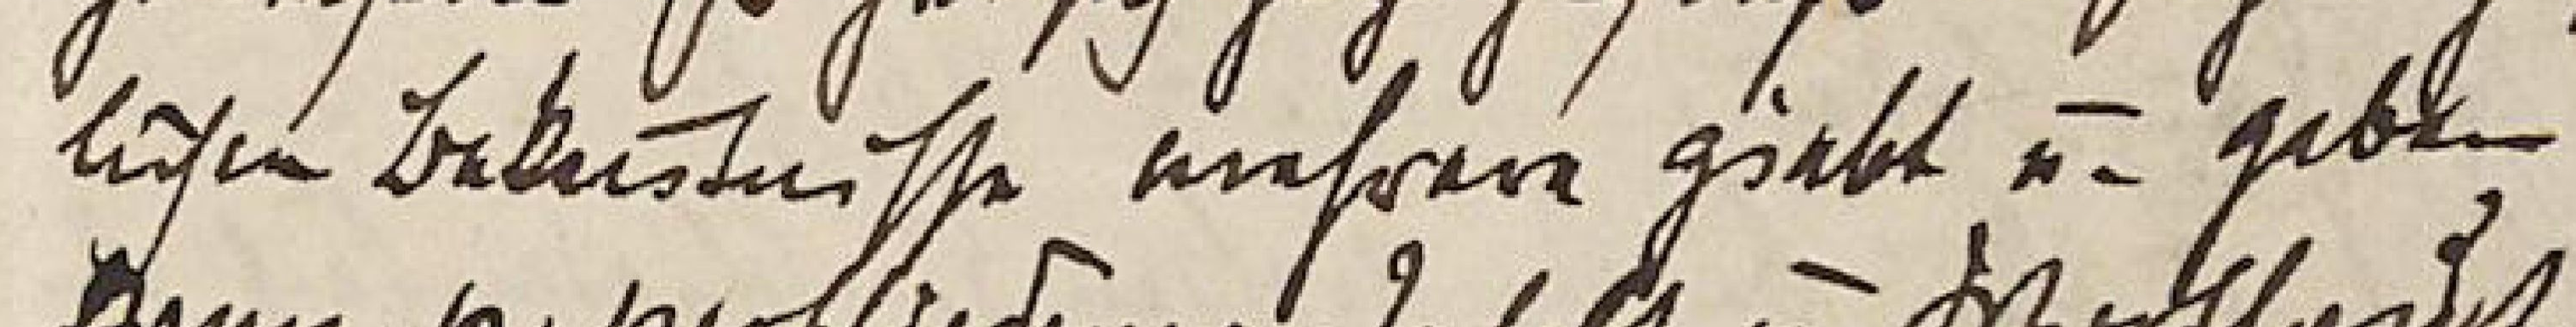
lichern Bekentnisse mehrere giebt u. geben
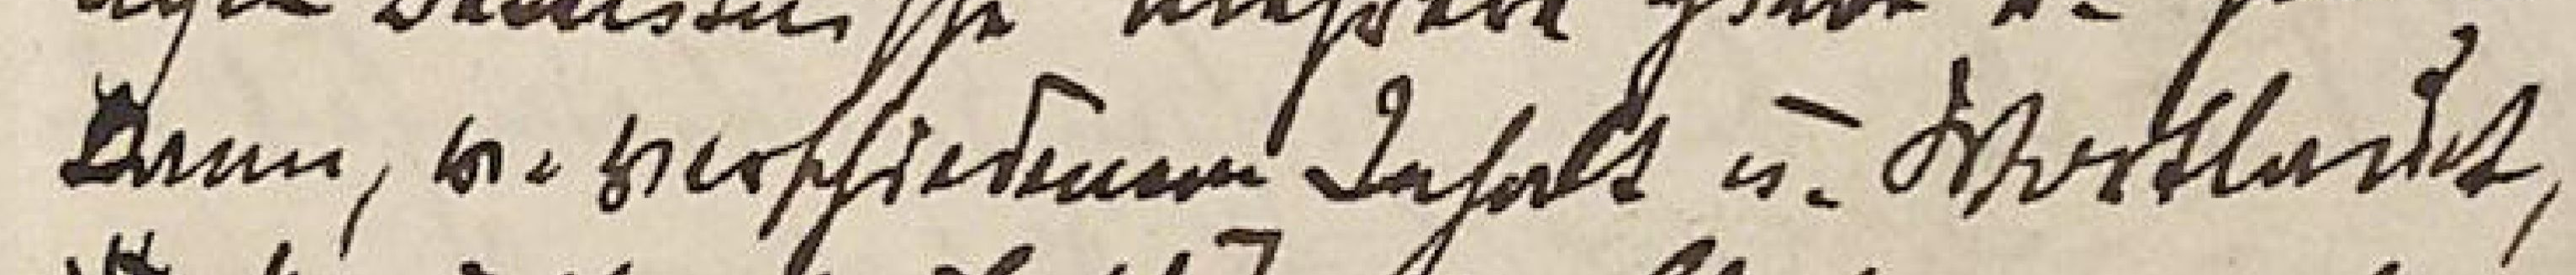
kann, v. verschiedenem Inhalt u. Wortlaut,
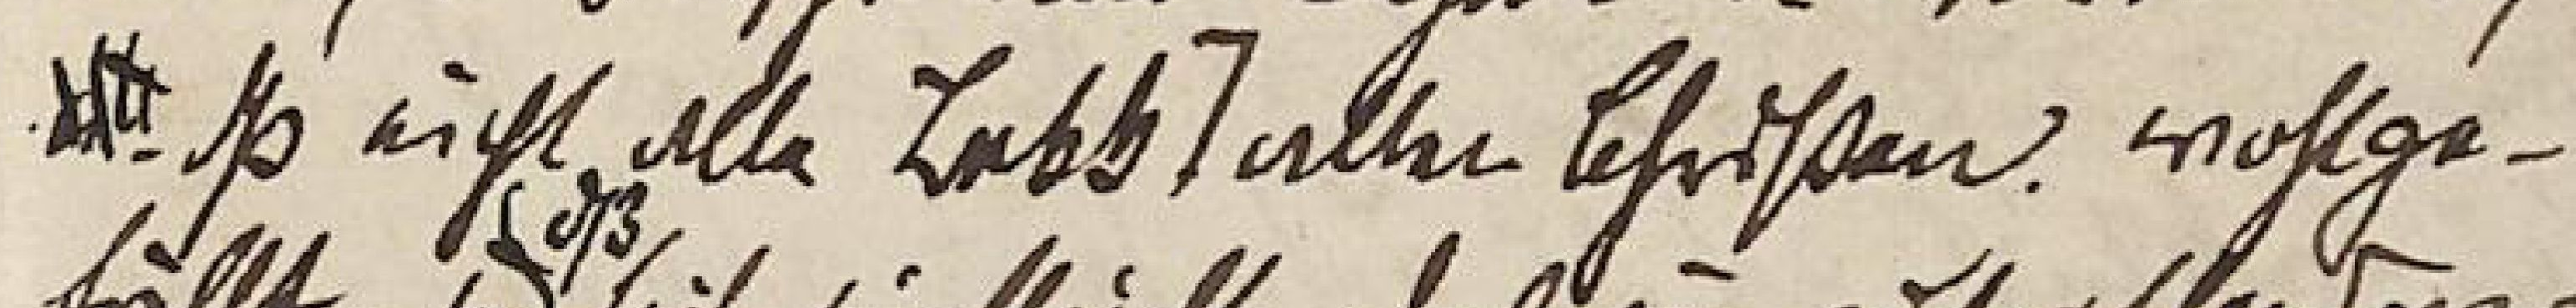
daß nicht all Bekk] allen Christen wohlge¬
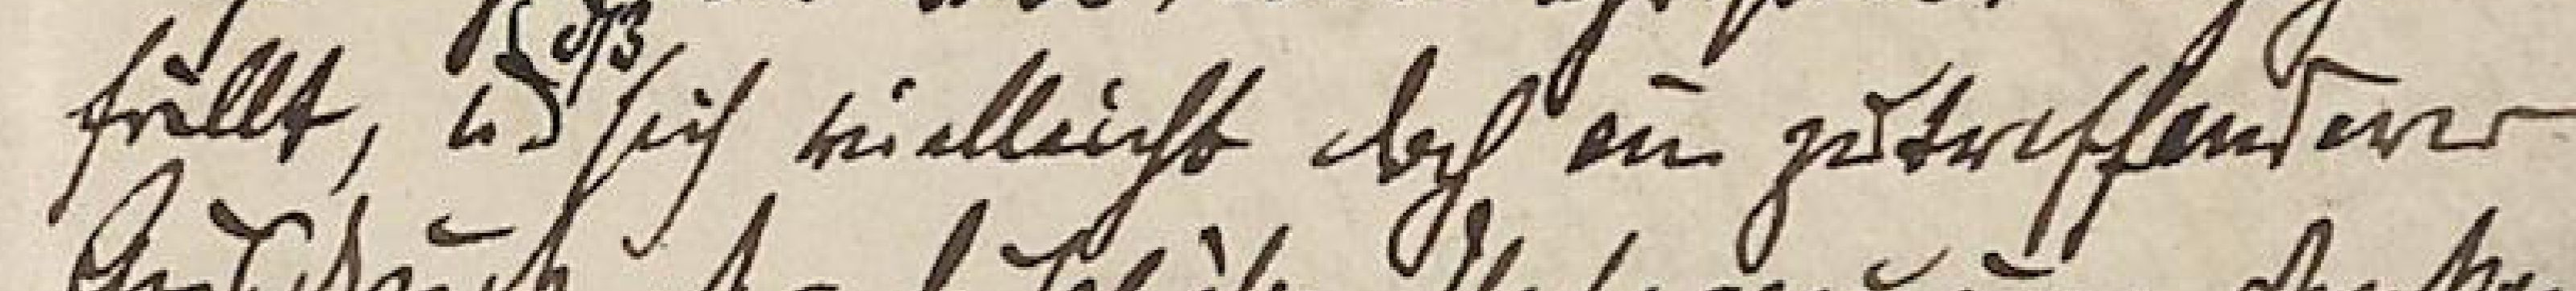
fällt, u. daß sich vielleicht doch ein zutreffenderer
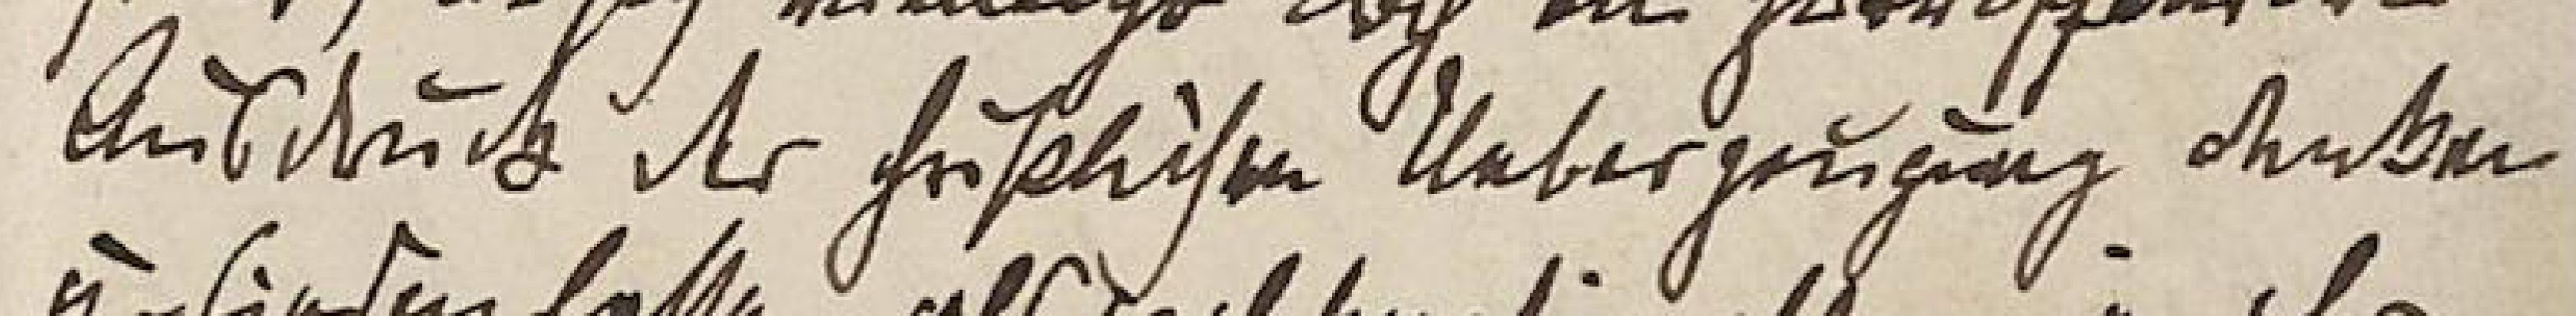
Ausdruck der christlichen Ueberzeugung denken
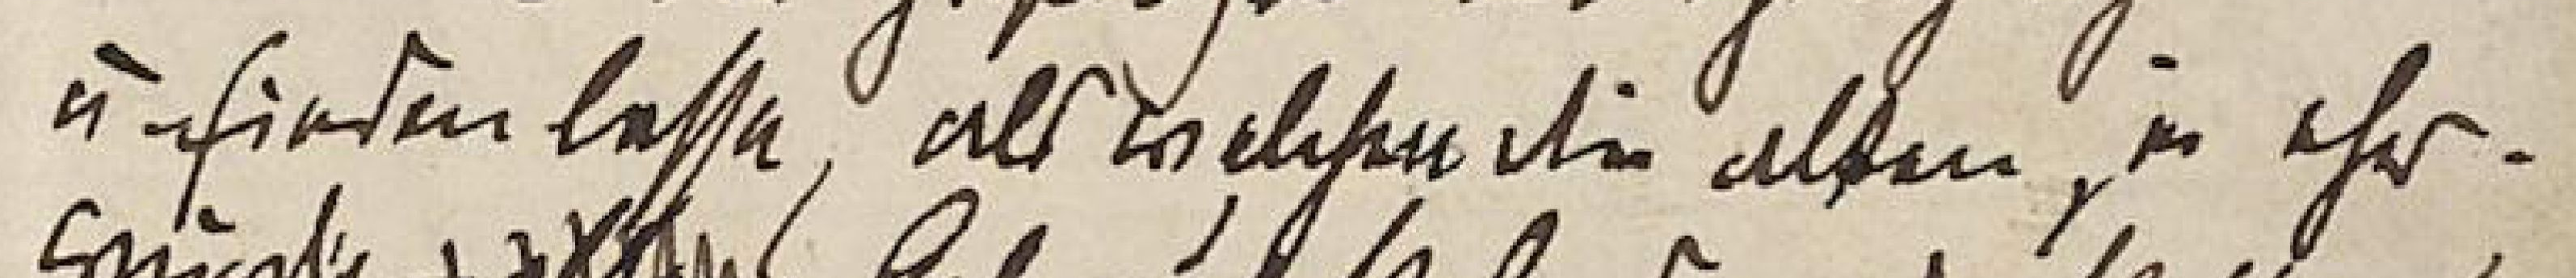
u. finden lasse, als welchen die alten, un ehr¬
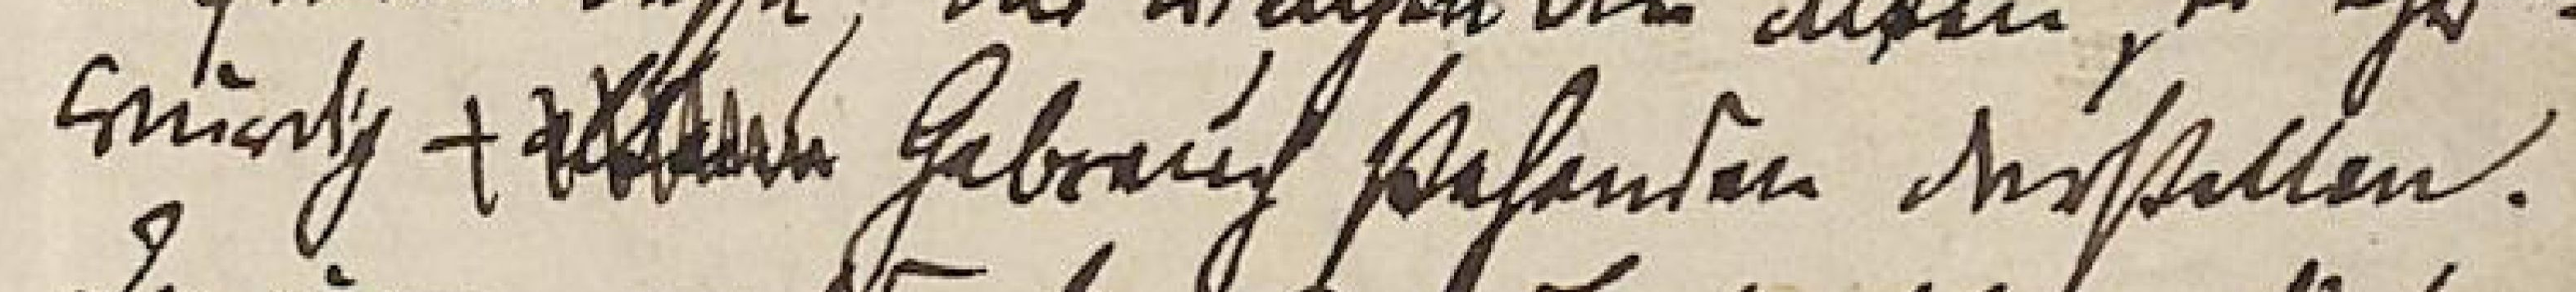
würdig . alten Gebrauch stehenden darstellen.
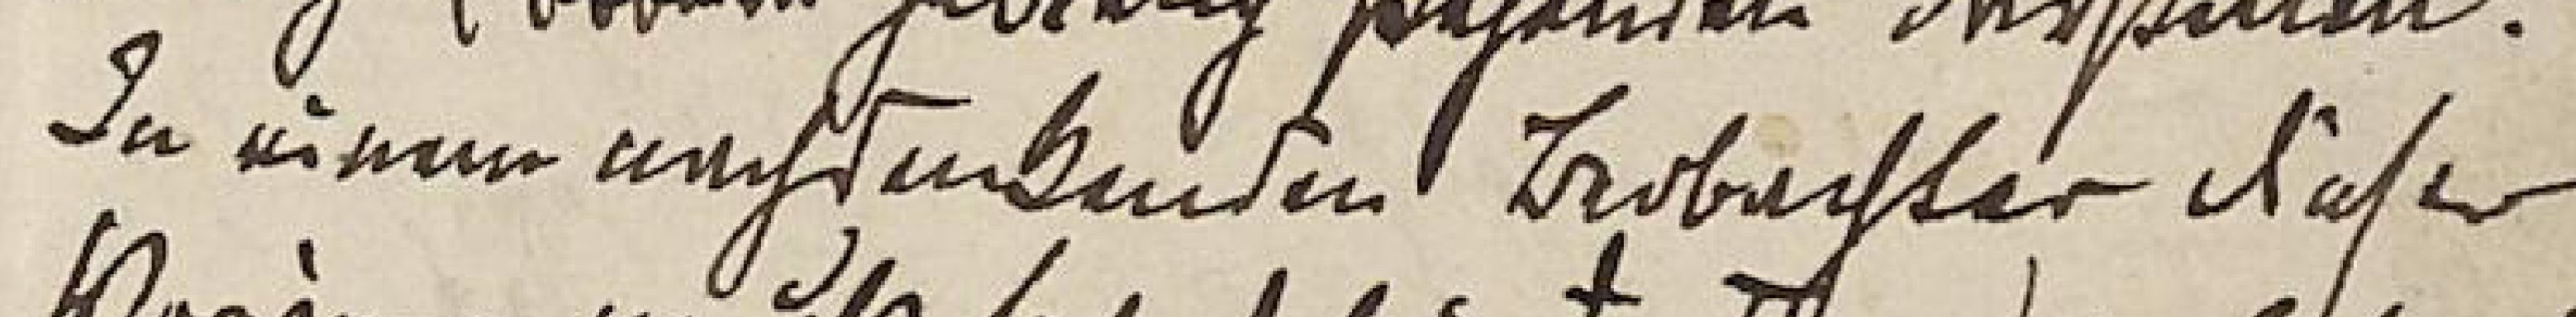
In einem nachdenkenden Beobachter dieser
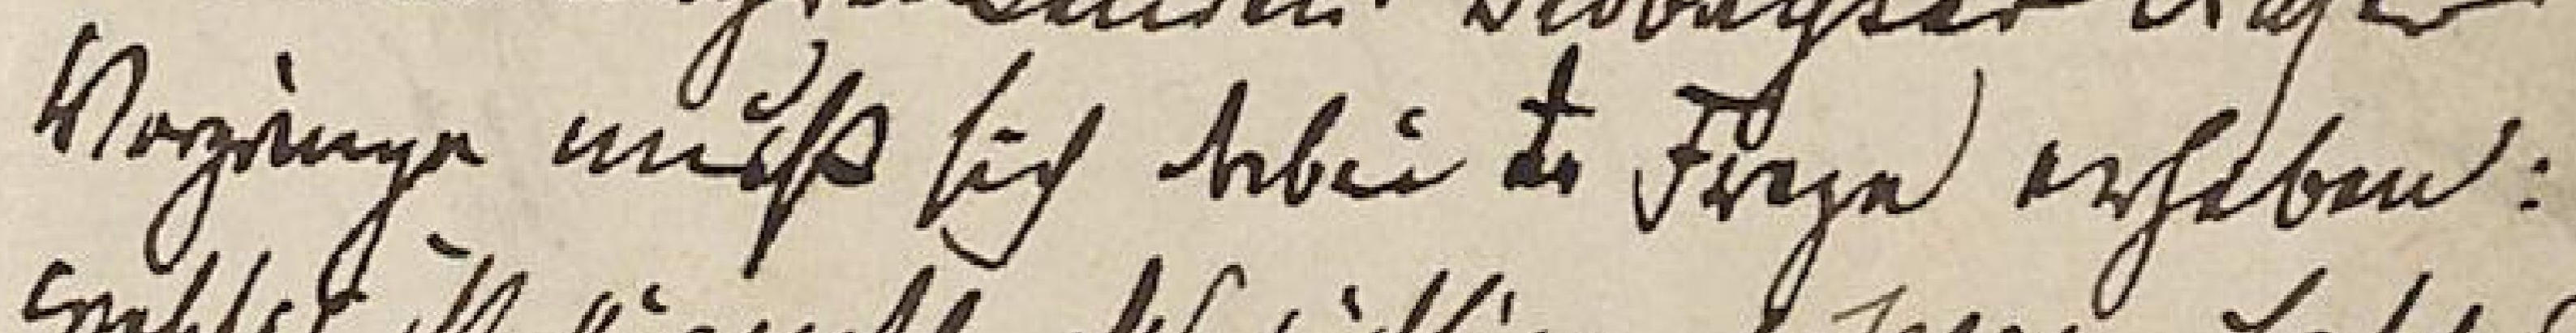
Vorgänge muß sich dabei d. Frage erheben:
